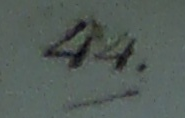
44.
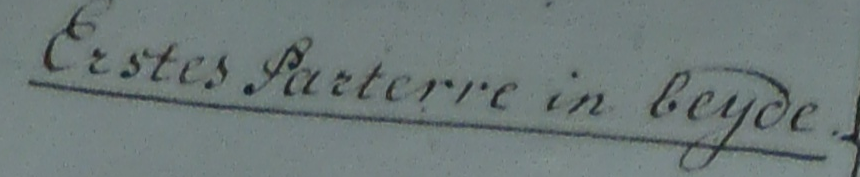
Erstes Parterre in beyde.
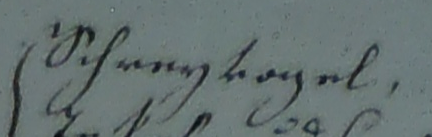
Schreyvogel,
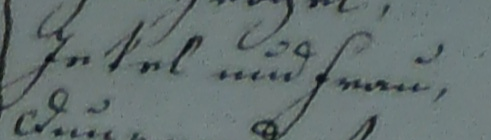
Jekel und Frau,
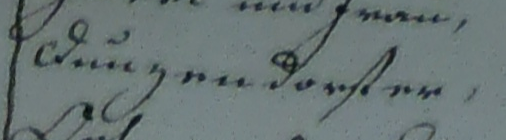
Dunzendorfer,
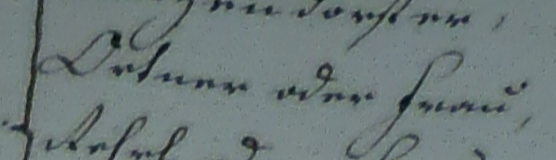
Ortner oder Frau,
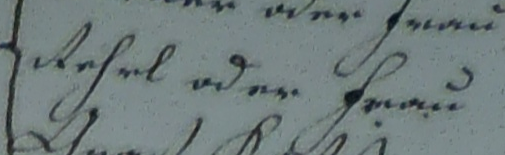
Rehrl oder Frau
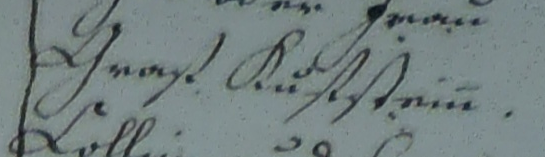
Graf Kufstein̅.
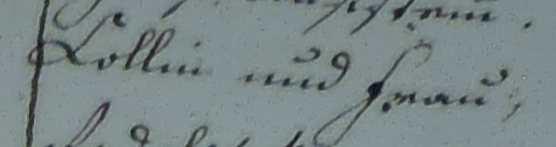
Collin und Frau,
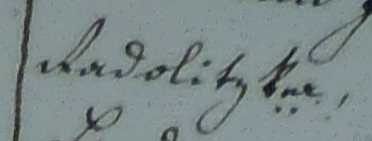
Radolitzka,
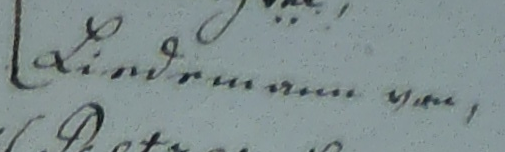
Lindemann von,
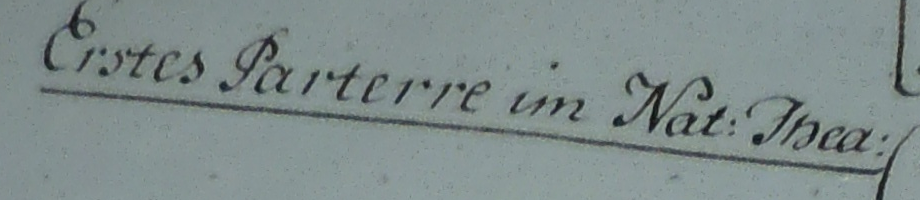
Erstes Parterre im Nat: Thea:
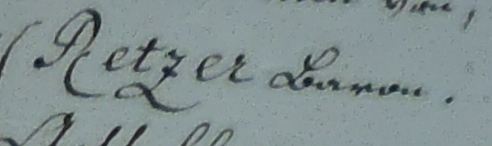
Retzer Baron.
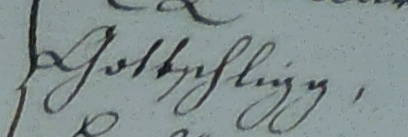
Gottschligg,
